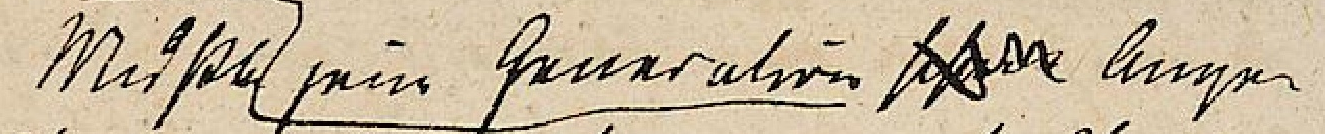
Mußte jene Generation schon Ange¬
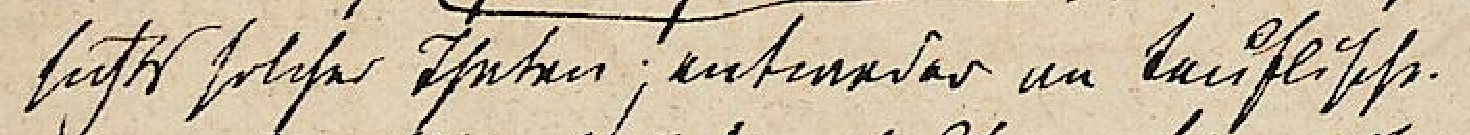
sichts solcher Thaten; entweder an teuflische
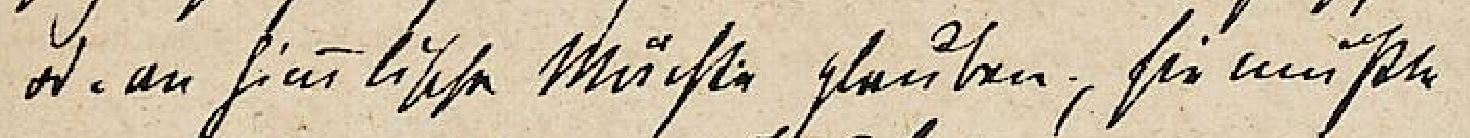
od. an himlische Mächte glauben. sie mußte
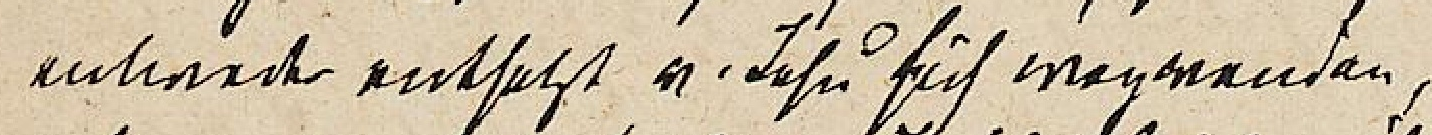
entweder entsetzt v. Jesu sich wegwenden,
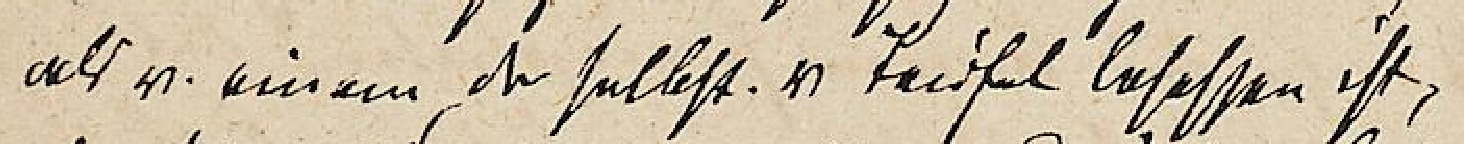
als v. einem, der selbst v. Teufel besessen ist,
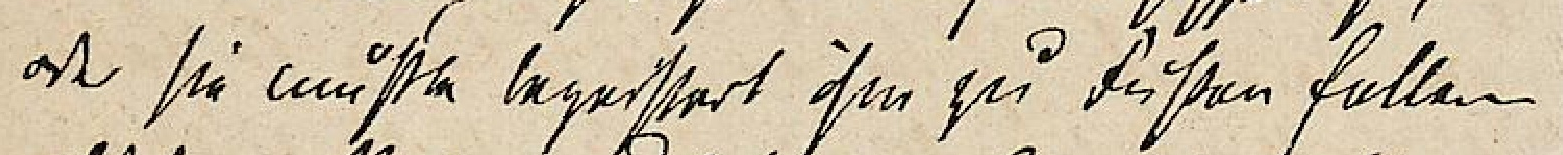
oder sie mußten begeistert ihm zu Füßen fallen,
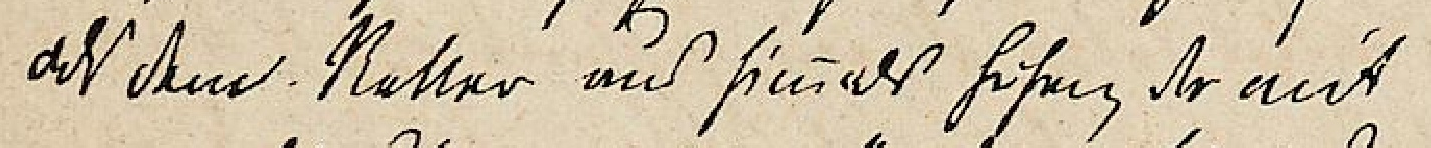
als dem Retter aus himmels Höhen, dr mit
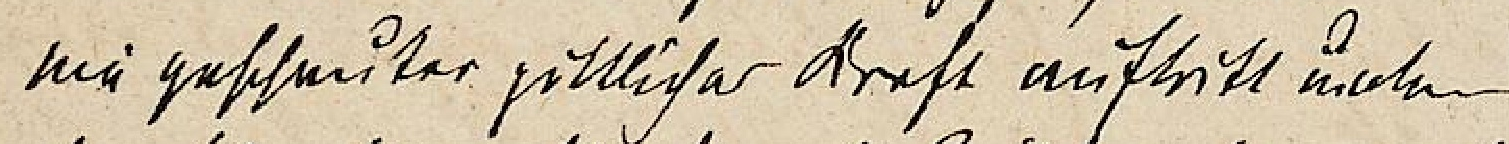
nie geschauter göttlicher Kraft auftritt unter
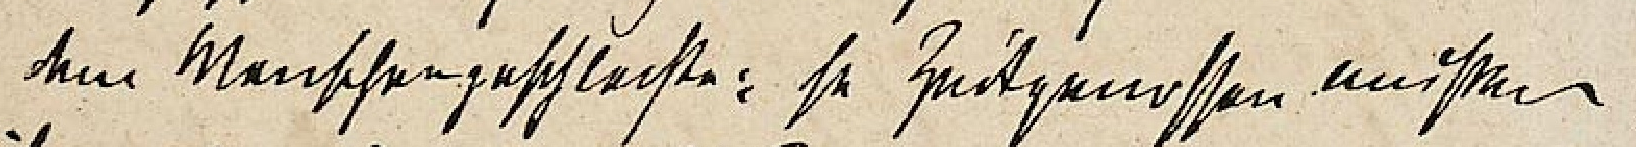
dem Menschengeschlechte: sn Zeitgenossen müßten
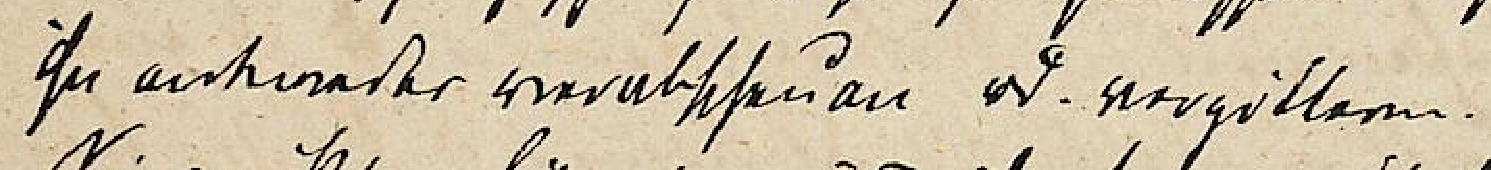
ihn entweder verabscheuen od. vergöttern
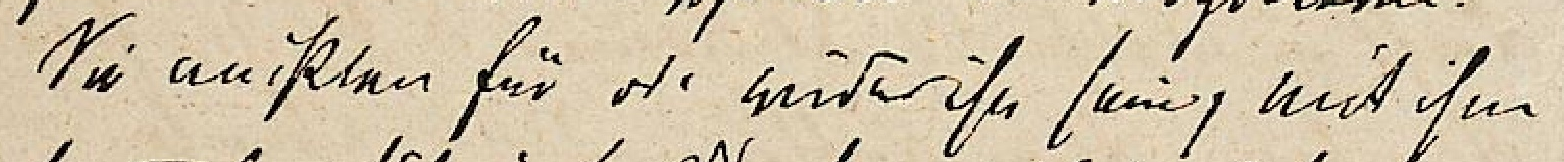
Sie müßten für od. wider ihn sein, mit ihm
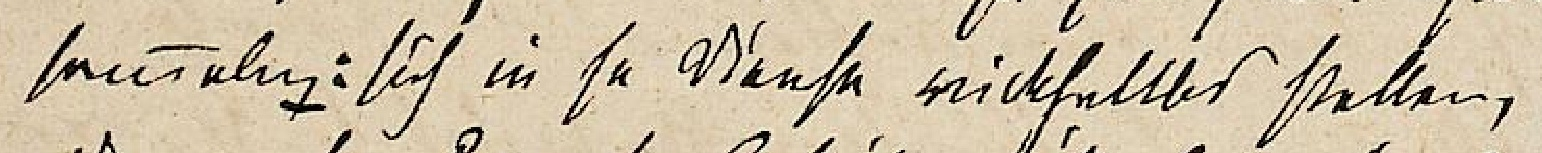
sameln: sich in sn Dienste rückhaltlos stellen,
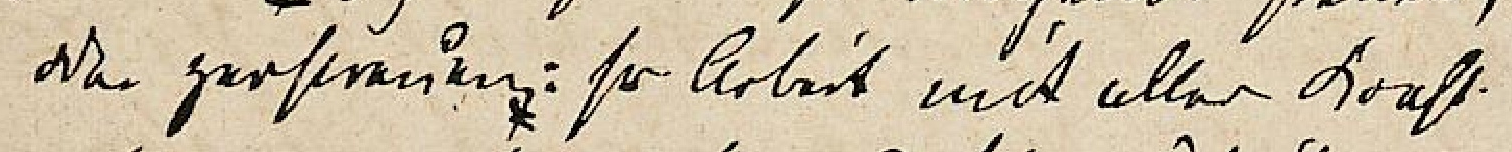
oder zerstreuen: sr Arbeit mit aller Kraft
